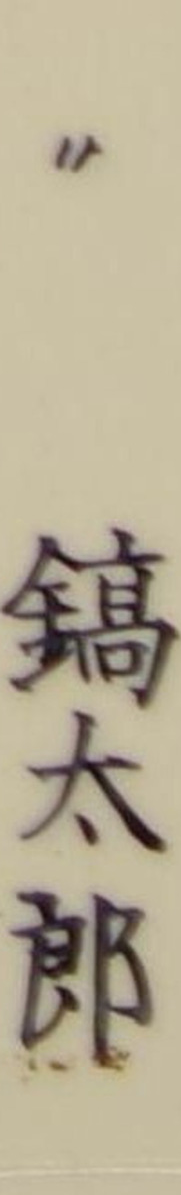鎬太郎
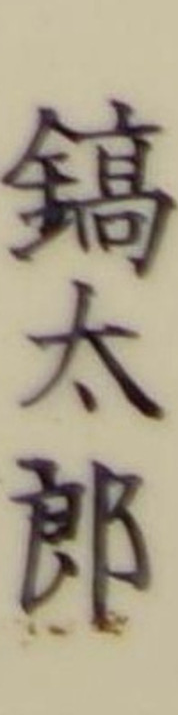鎬太郎
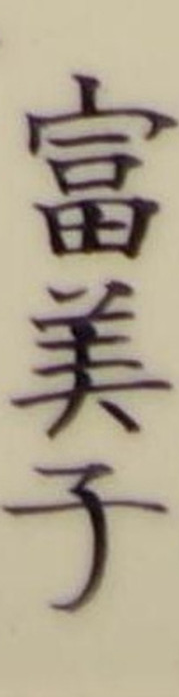富美子
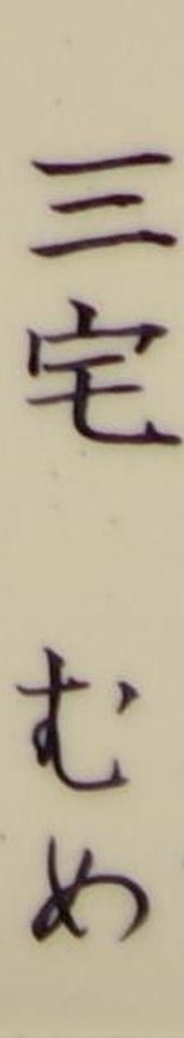三宅むめ
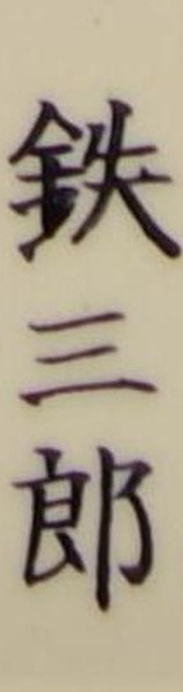鉄三郎
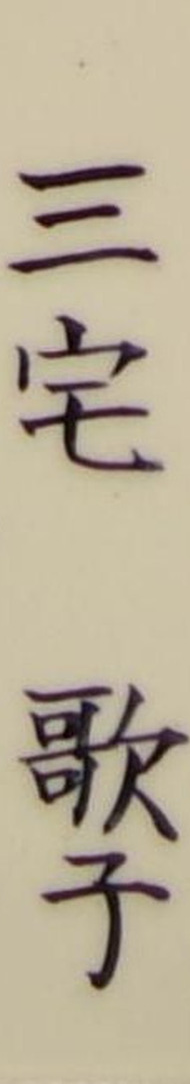三宅歌子
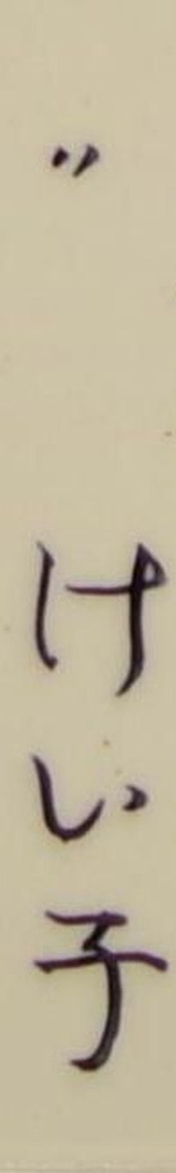けい子
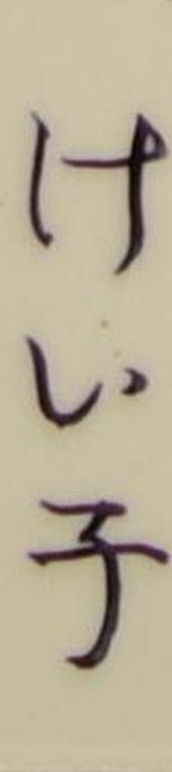けい子

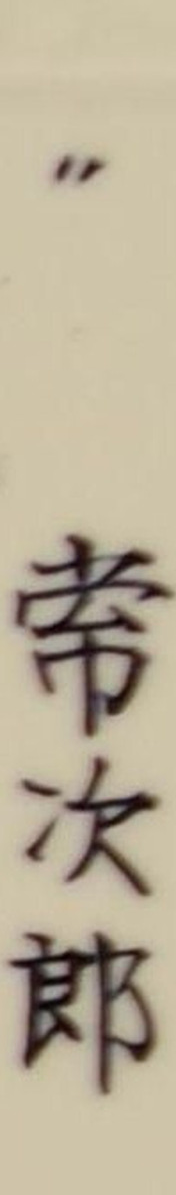常次郎
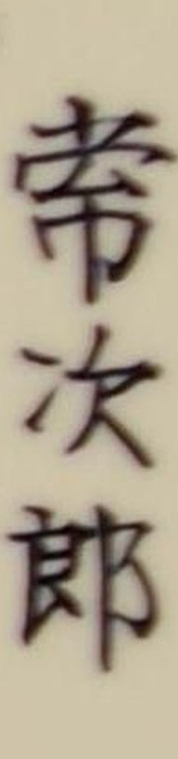常次郎
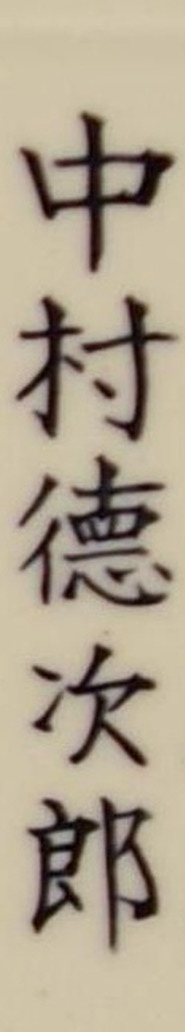中村徳次郎
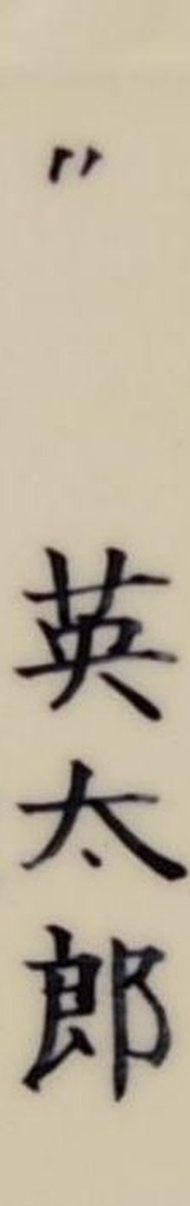英太郎
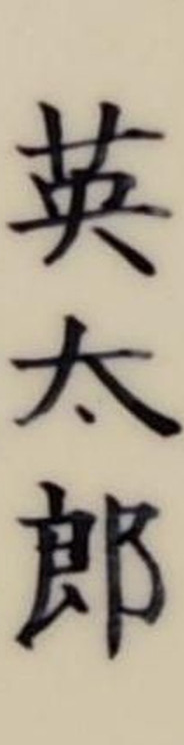英太郎
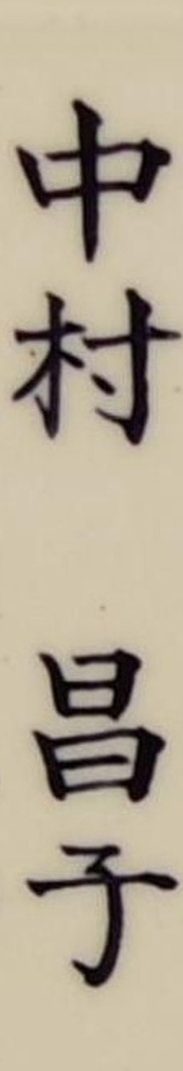中村昌子
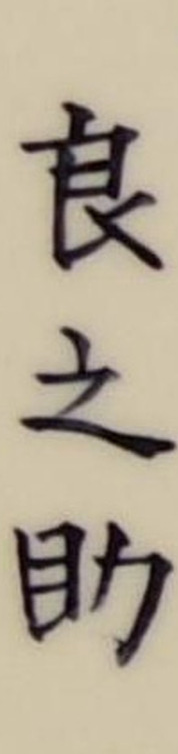良之助
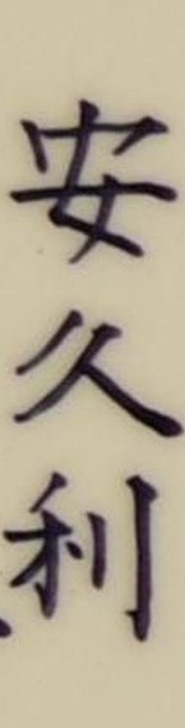安久利
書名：E~L
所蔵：高野山金剛峯寺
